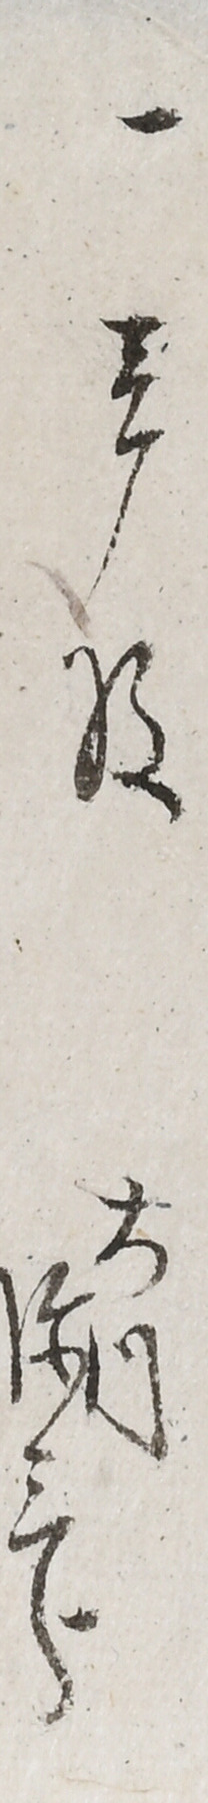一壱枚弥三郎
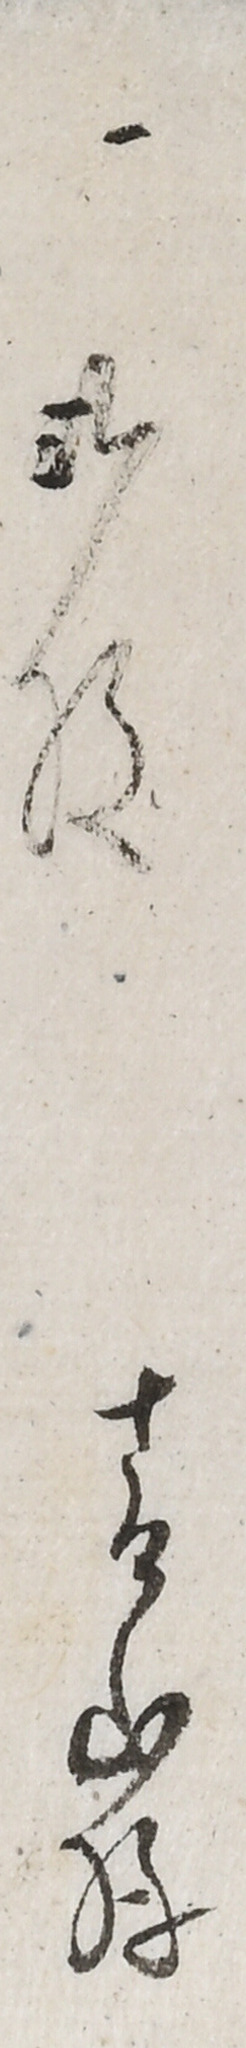一弐枚青山様
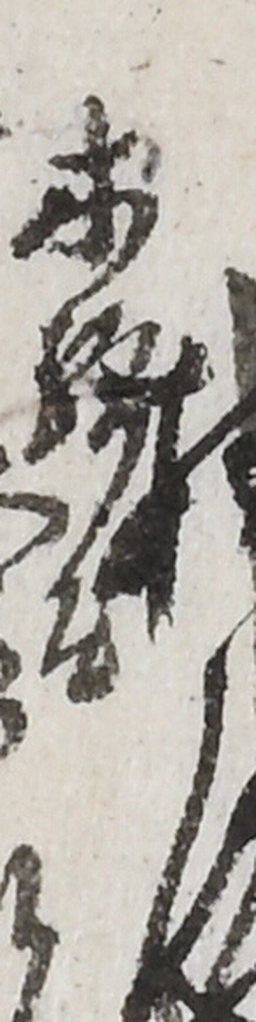木綿屋
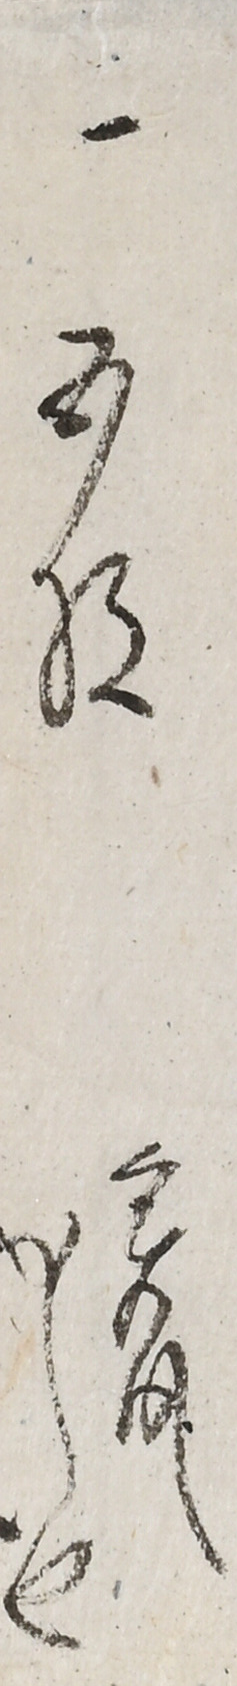一五枚加や
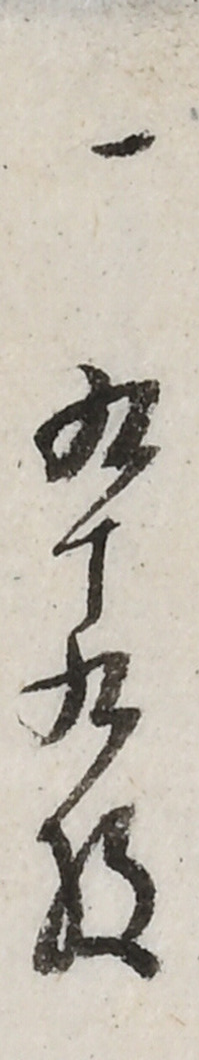一九十九枚
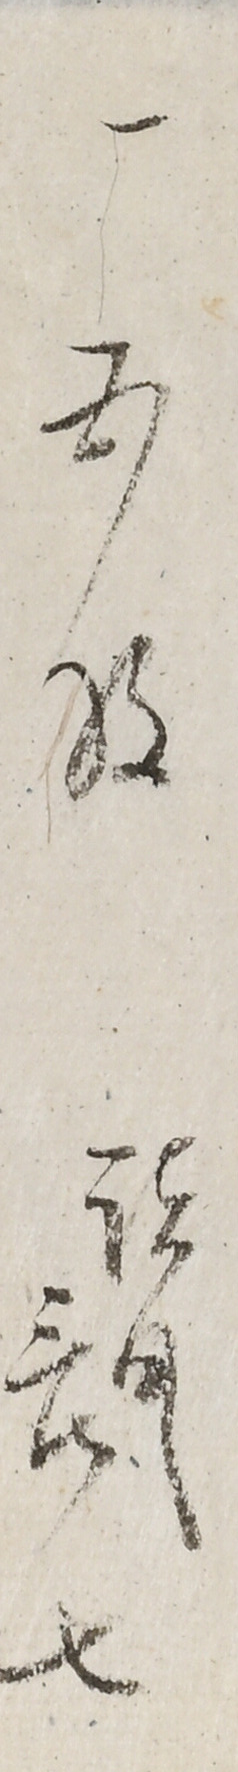一五枚善七
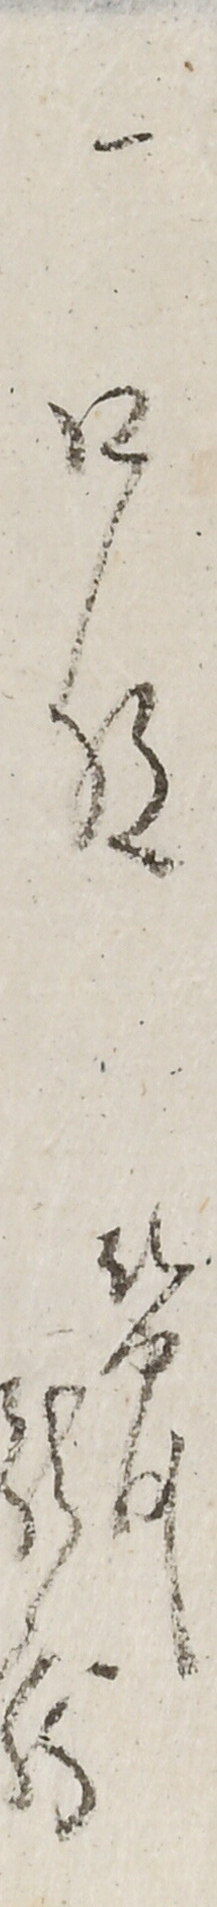一四枚滝蔵
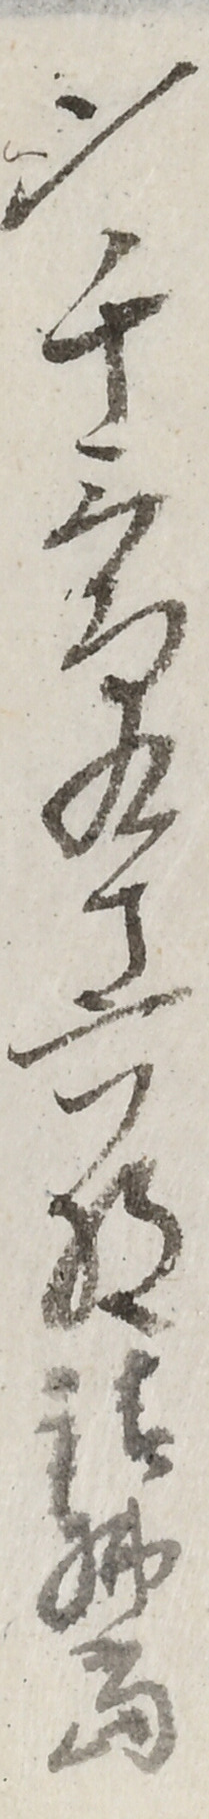〆千三百九十六枚請払当
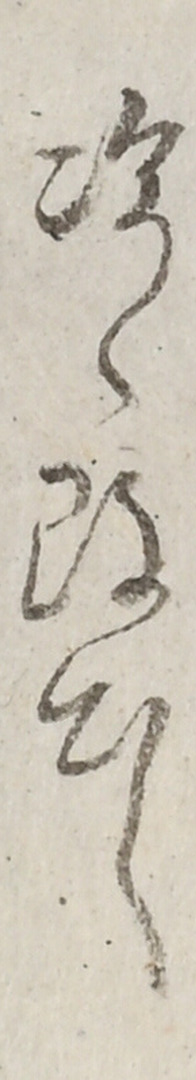次へ改出し

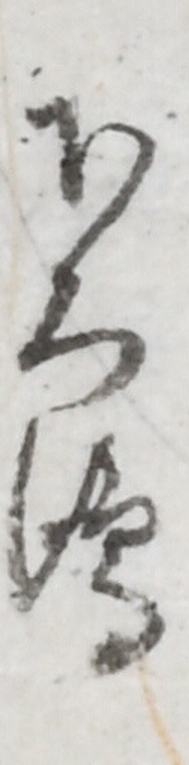下大嶋
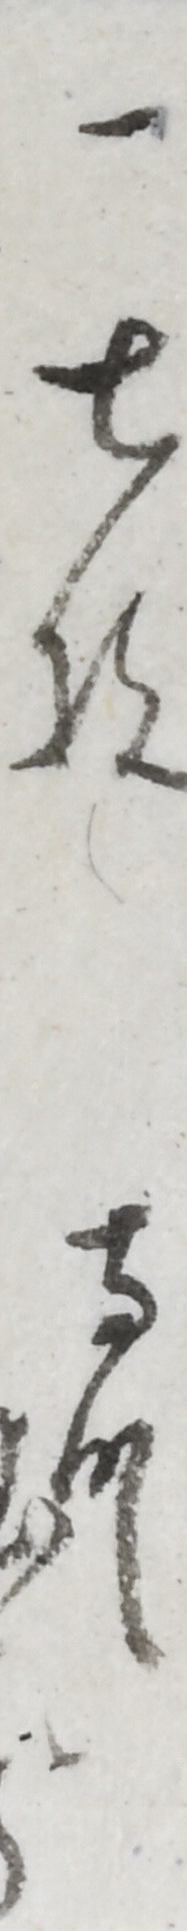一七枚徳蔵
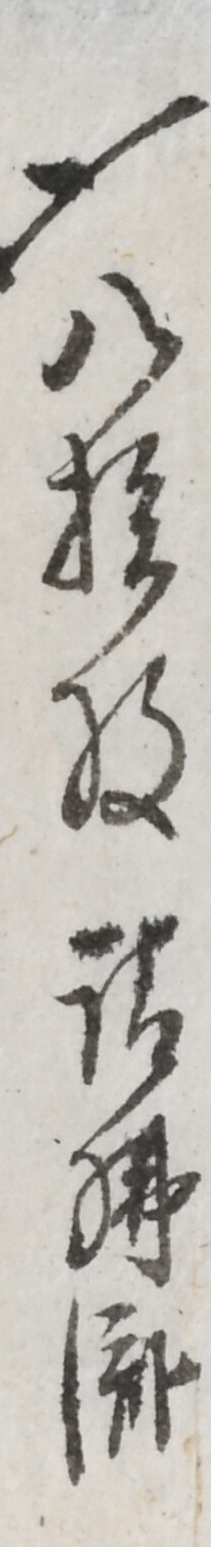〆八拾枚請払済
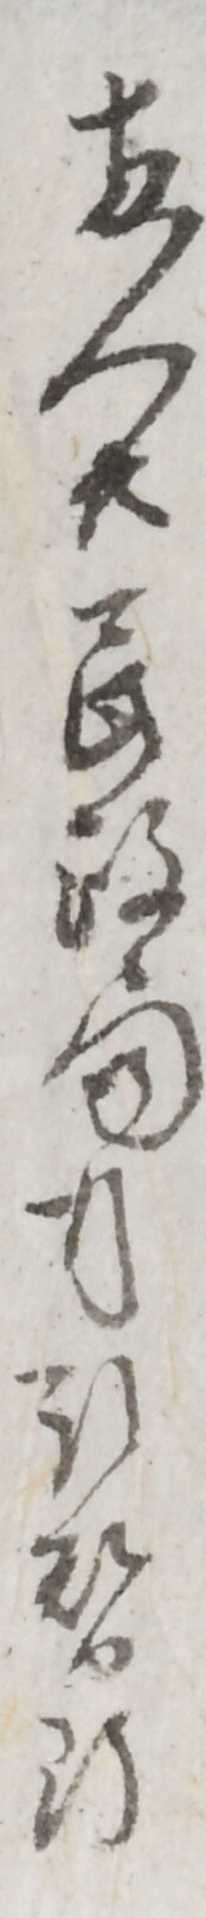両人共民政局共引替断
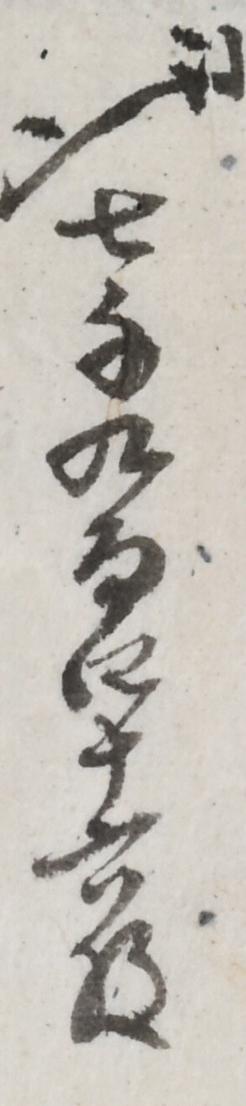〆七千九百四十六枚
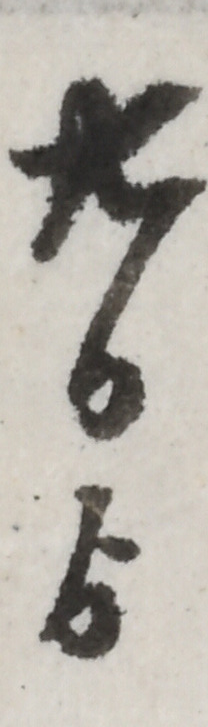廿日ゟ
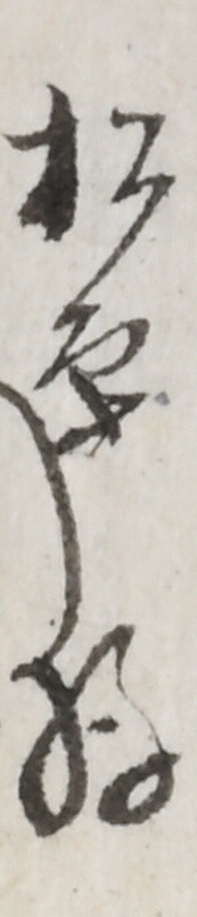松原様
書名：髙遠限楮幣引換覚帳
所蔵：伊那市立高遠町図書館・合同会社AMANE
